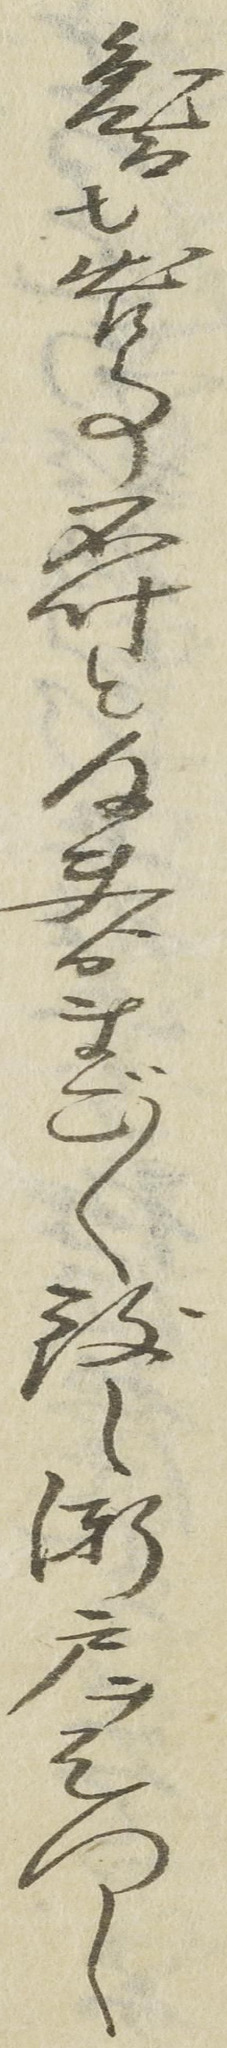勉而も出候事不叶と存夫ゟまご〳〵致し漸戸ヲはつし
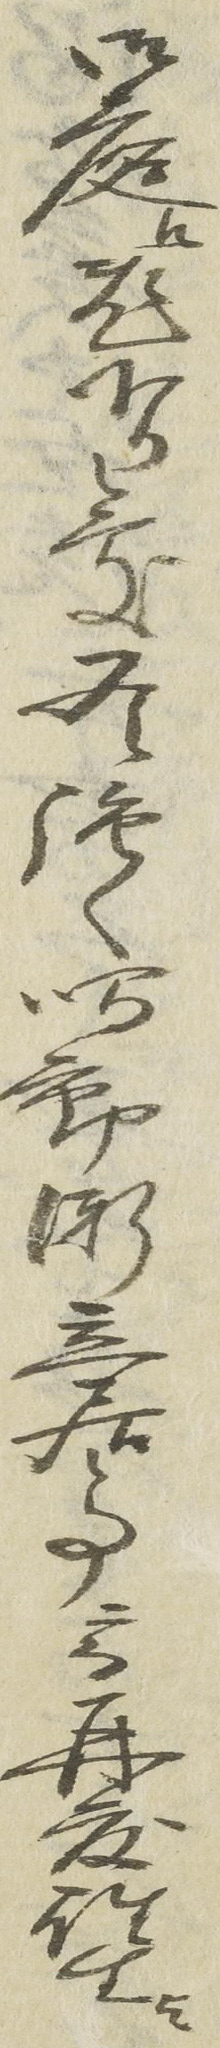御庭江飛下り候処又〻強く鳴動漸立居候事ニ而再度往生と
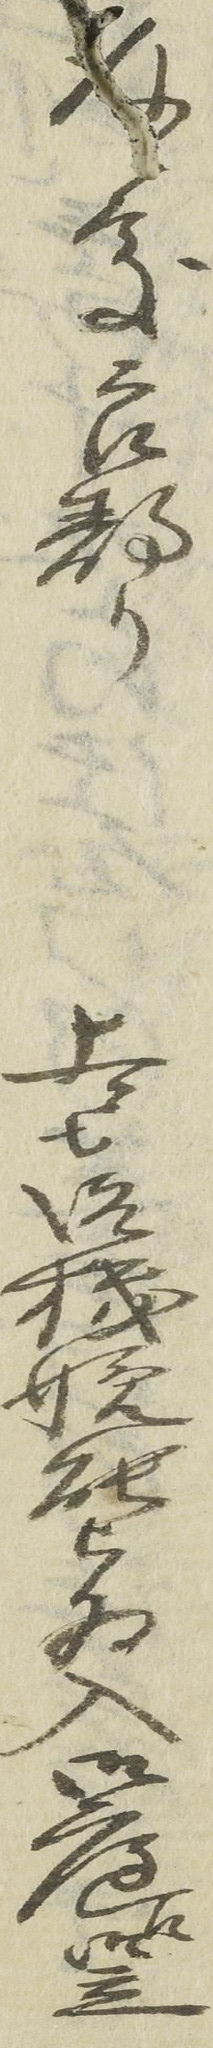成候処良静り上にも御機嫌能被為入御庭江御立
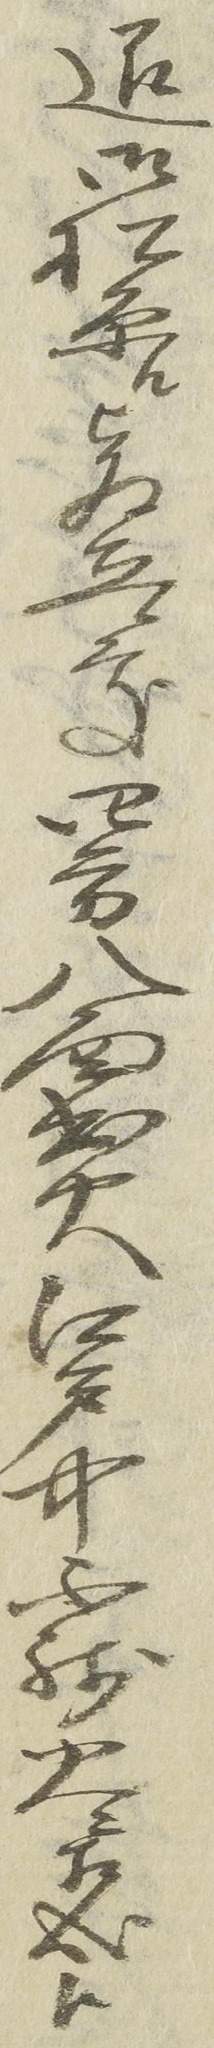返御松原江被為立候処四方八面出火江戸中不残火ニ相成候
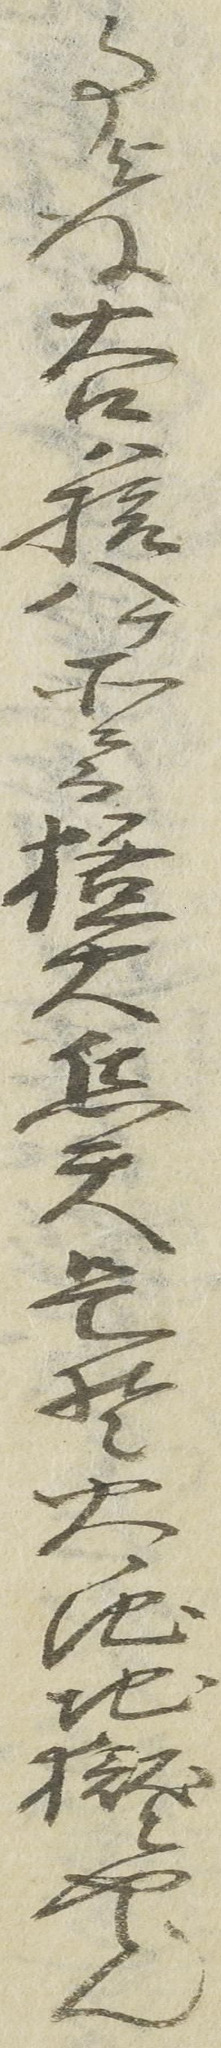事と存火口は拾八ケ所ニ而猛火焦天是そ火ノ池地獄にやらん
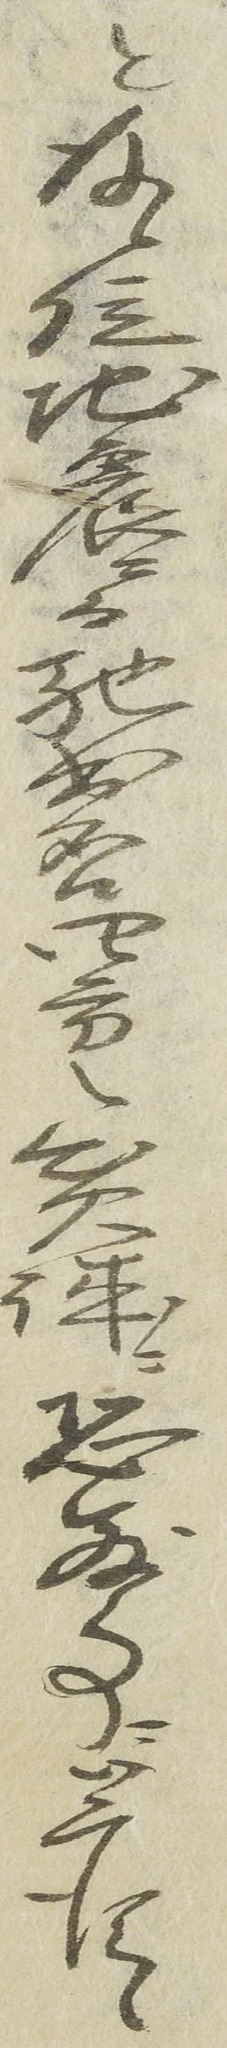と存候位地震ニ而馳出否四方之出火誠ニ恐敷事ニ御座候
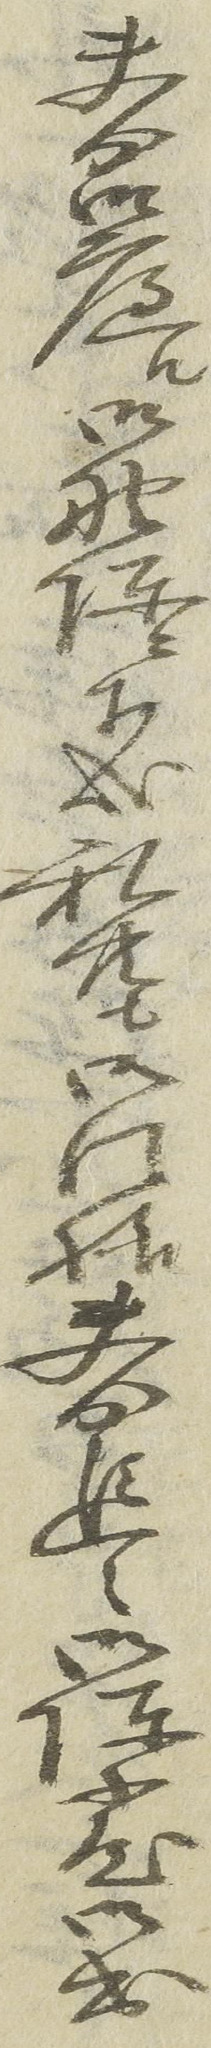夫ゟ御庭江御野陣ニ相成私共も御同様夫ゟ追〻御陣小屋御出
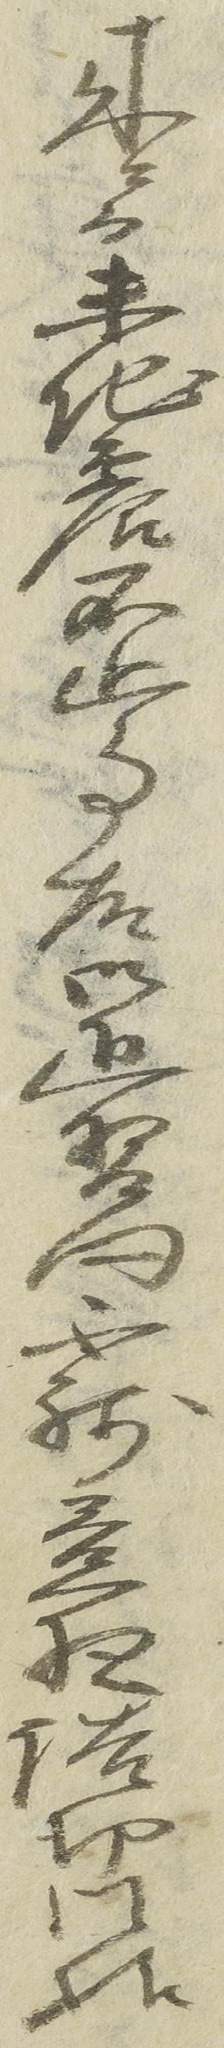来ニ而未地震不止事故御近習向不残昼夜詰切同様ニ而

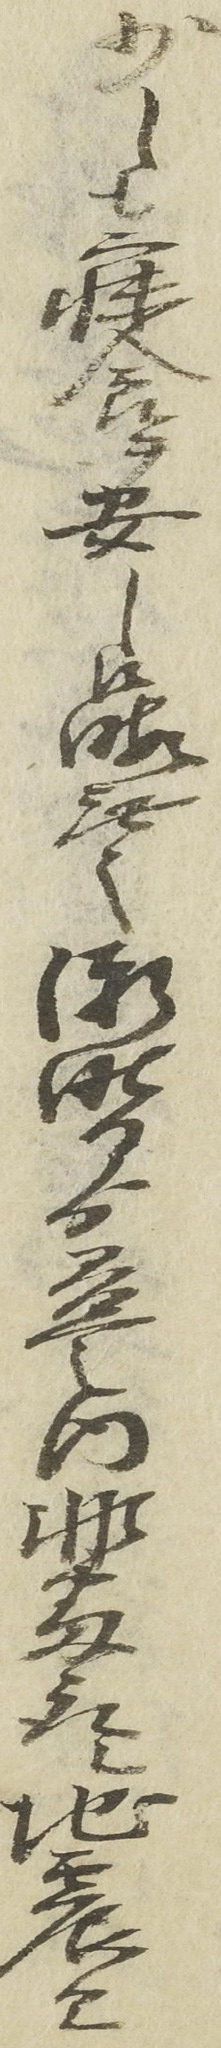少しも寝食ヲ安し候暇無之漸昨日ゟ昼之内非番取レ地震已
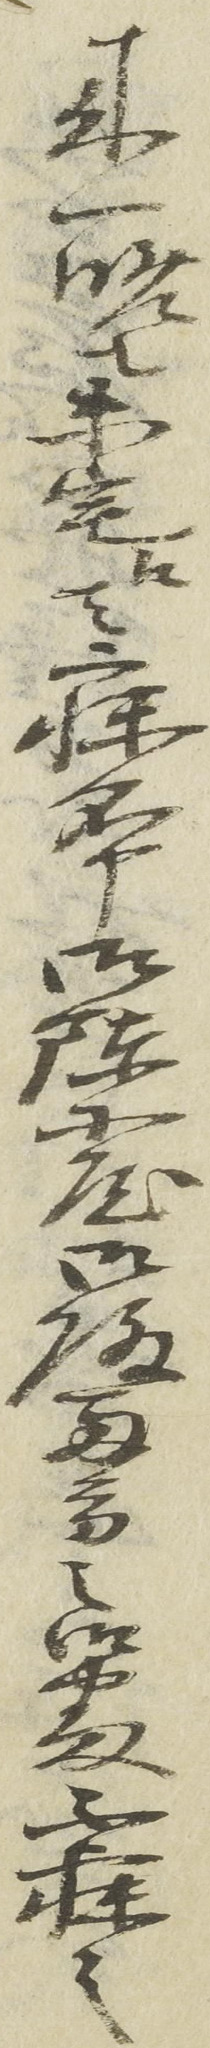来一晩も本宅江は寝不申御陣小屋御殿両分之御番不寝之
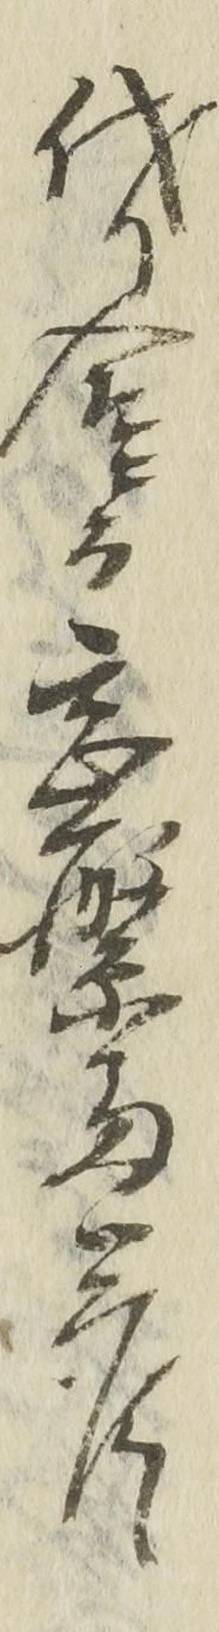代り合ニ而甚繁多御座候
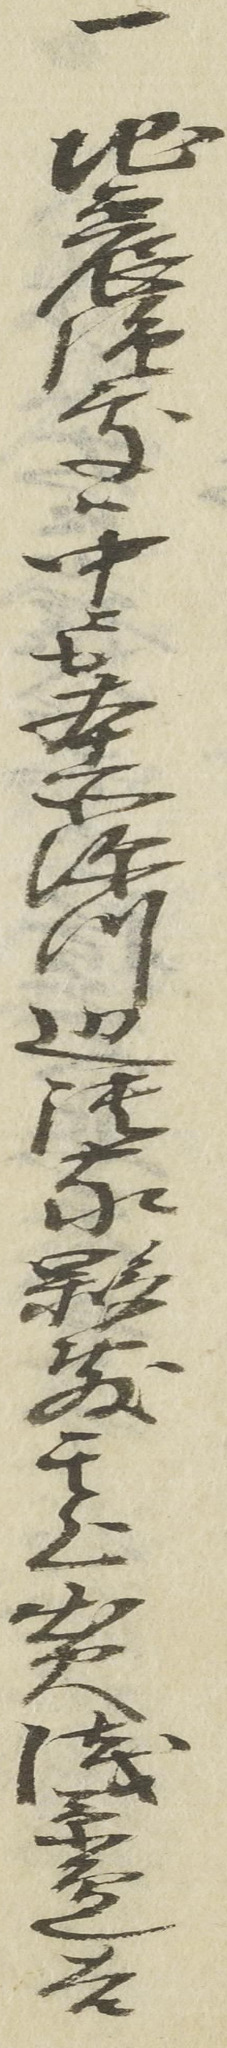一地震強処ハ中ニも本所深川辺潰家夥敷其上出火浅草辺吉
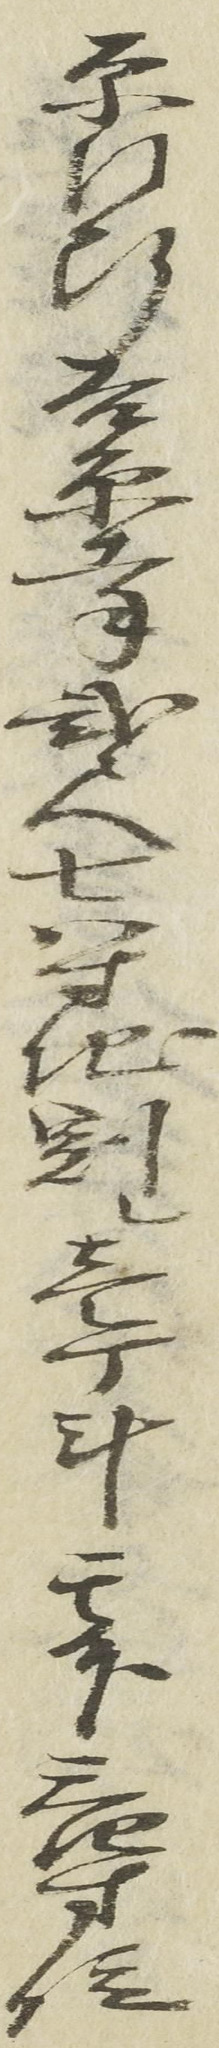原同断吉原土手弐尺七八寸地割レ壱丁計其外三四寸位
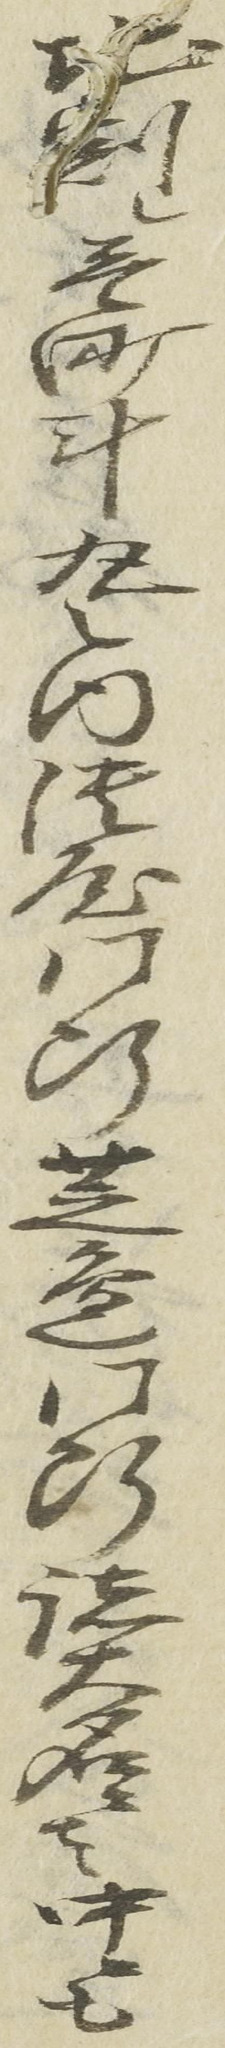地割れ壱町計丸之内潰屋同断芝辺同断諸大名ニは中ニも
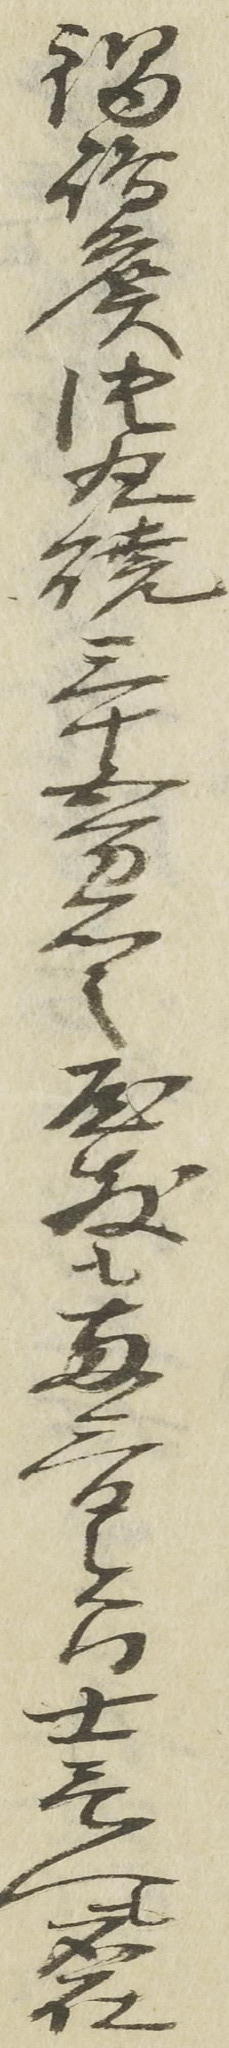鍋嶋侯潰丸焼三十五万石之屋敷も両三日之間士一人も不在
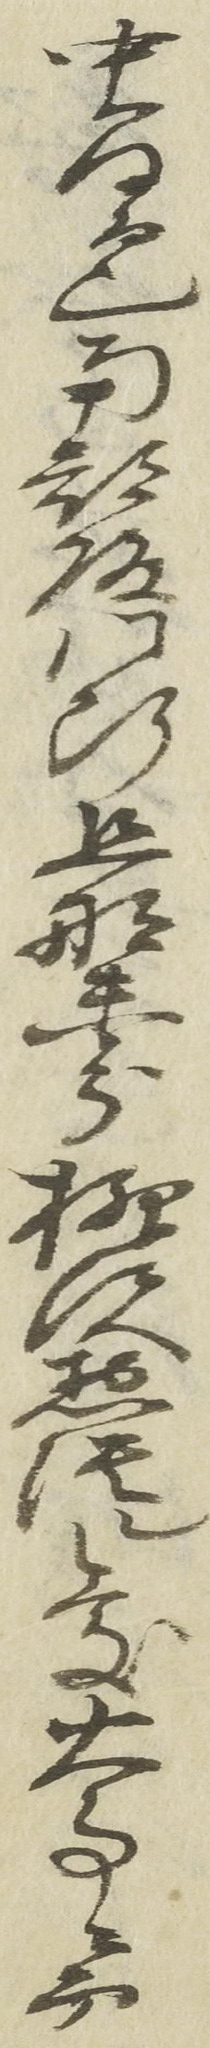中間而巳南部殿同断上野未分柳沢惣潰候処火事ニ而
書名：安政乙卯江戸大地震筆記　安政丙辰八月大阪大雷雨之記追加　安政三辰年七月松前辺大地震并八月大風雨記録
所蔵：東京大学地震研究所図書室 Earthquake Research Institute Library, The University of Tokyo, JAPAN
